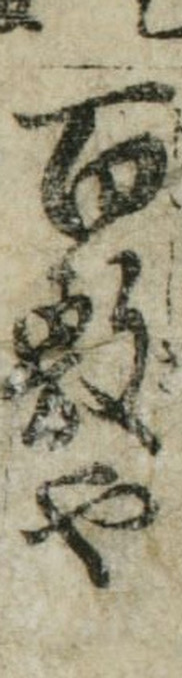百敷や
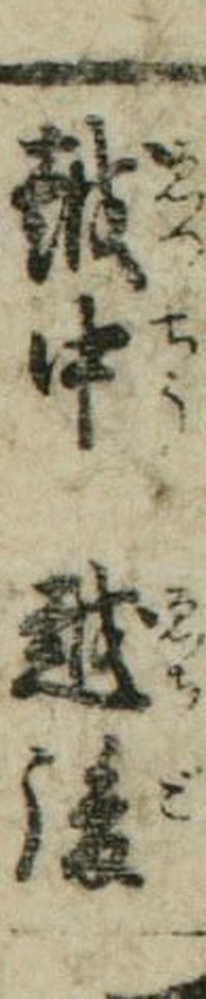越中越後
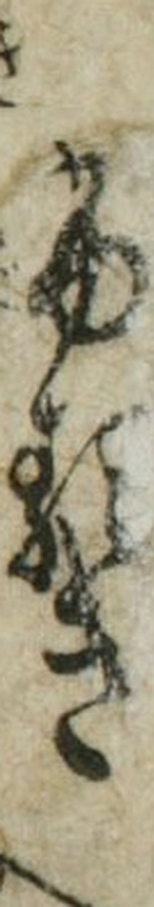ふるき
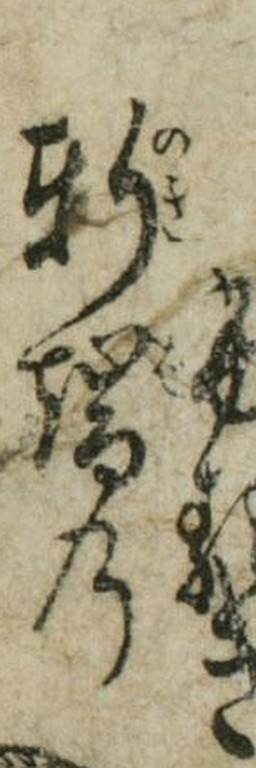軒端の
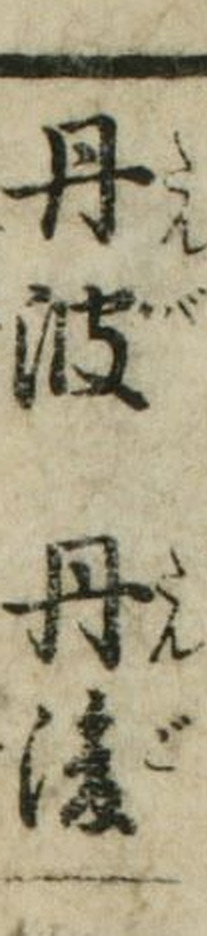丹波丹後
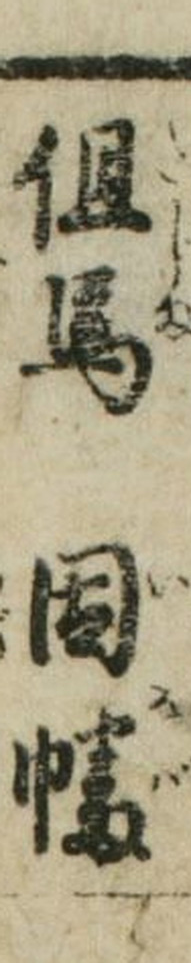但馬因幡
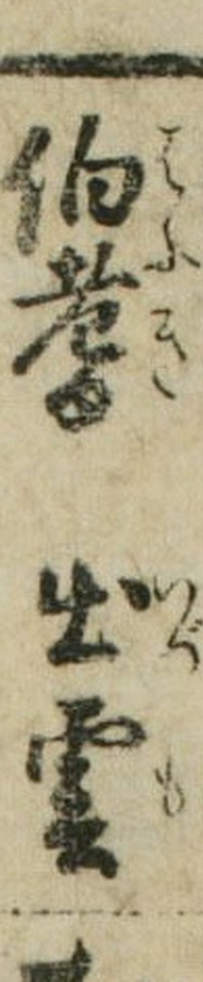伯耆出雲
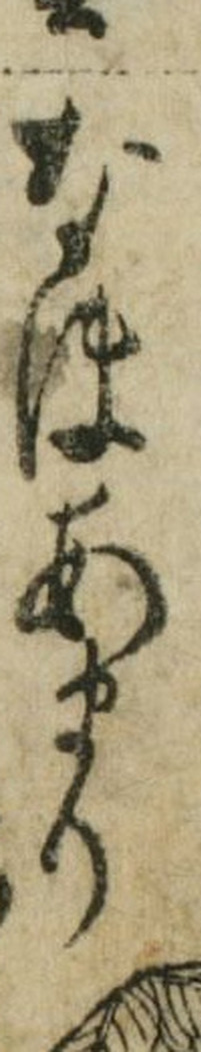なほあまり
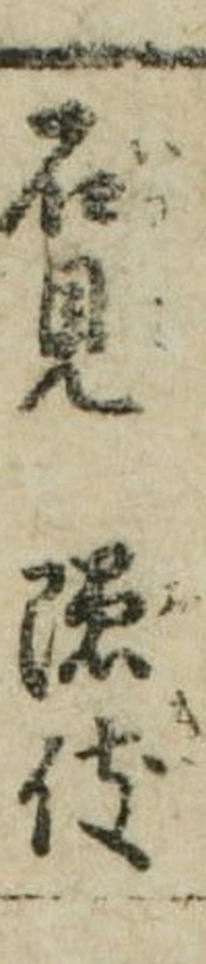石見隠伎
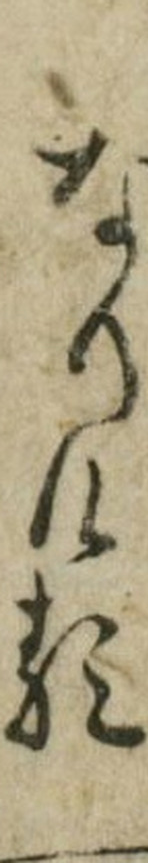なりける
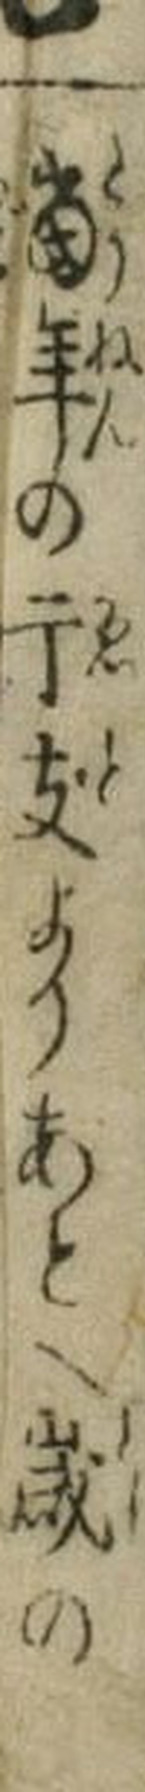当年の干支よりあとへ歳の
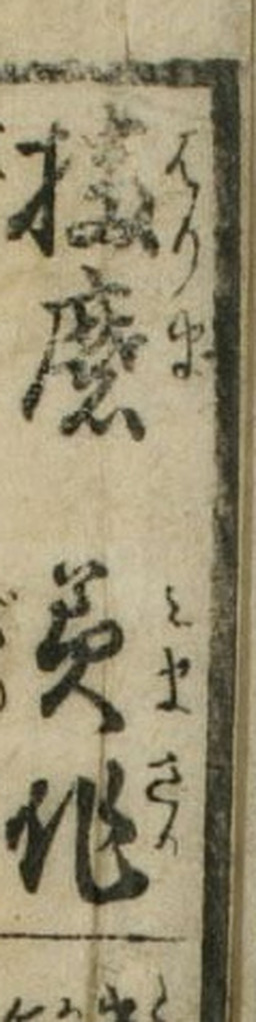播磨美作
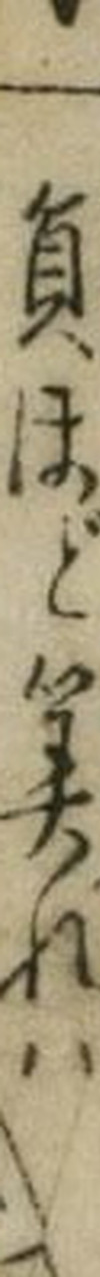員ほど算れは
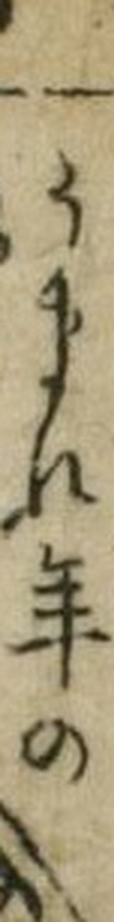うまれ年の
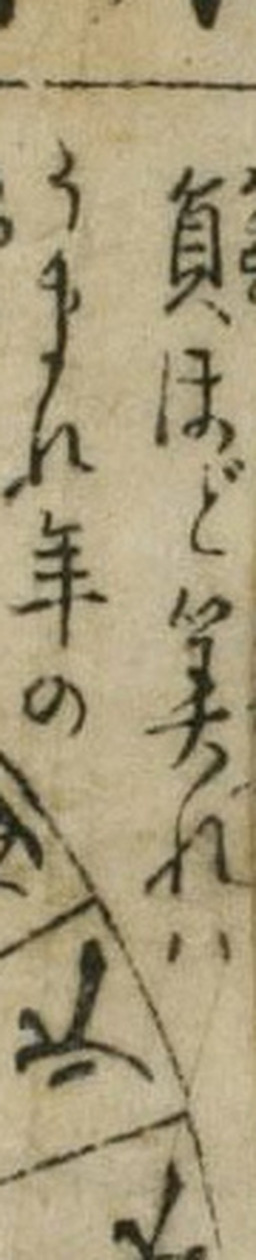うまれ年の
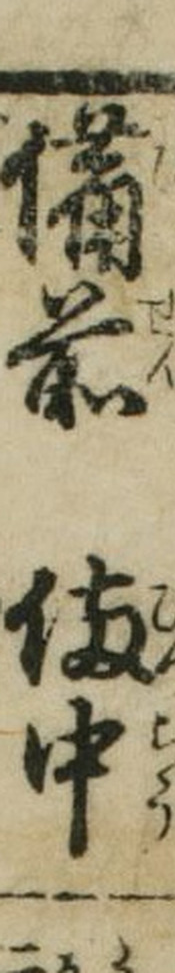備前備中
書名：百人一首
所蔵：東京学芸大学教育コンテンツアーカイブ
